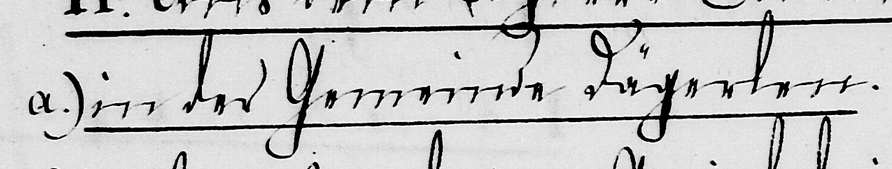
a.) in der Gemeinde Dägerlen.
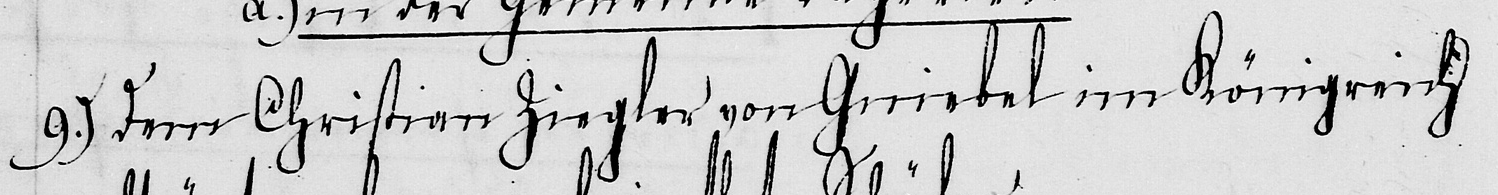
9.) Dem Christian Ziegler von Gniebel im Königreich
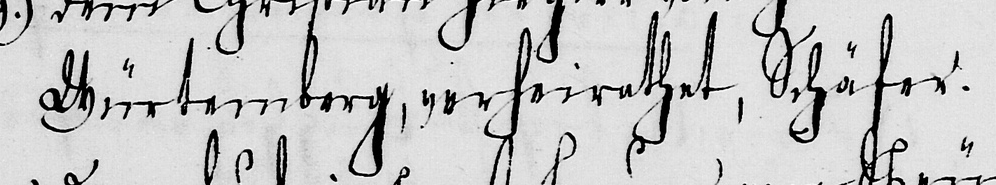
Würtemberg, verheirathet, Schäfer.
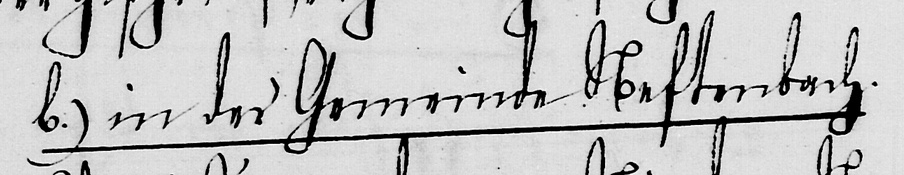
b.) in der Gemeinde Neftenbach.
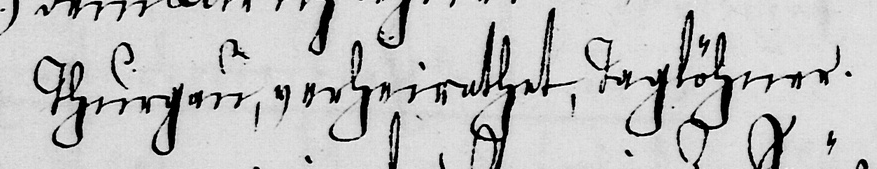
Thurgau, verheirathet, Taglöhner.
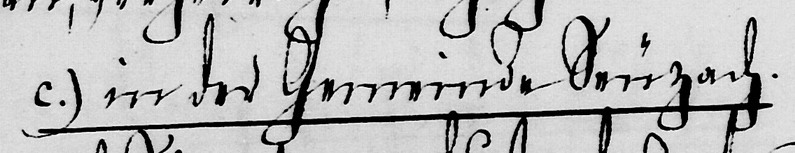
c.) in der Gemeinde Seuzach.
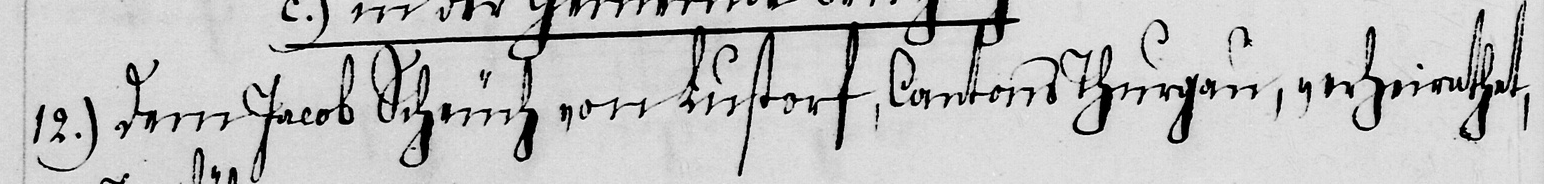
12.) Dem Jacob Scheuch von Lustorf, Cantons Thurgau, verheirathet,
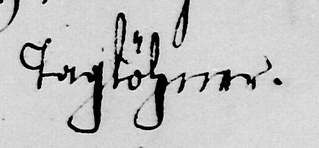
Taglöhner.
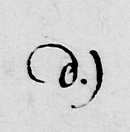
6.)
